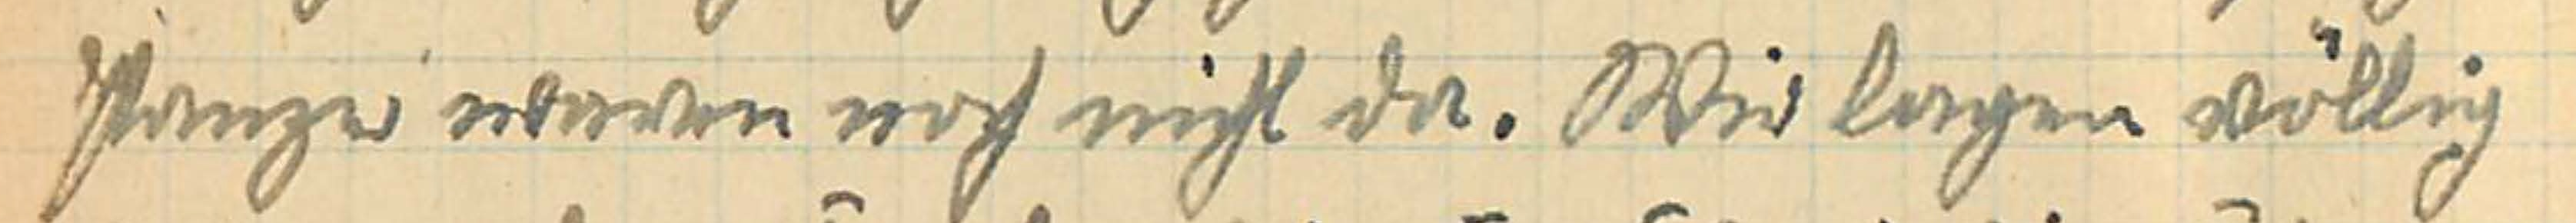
Panzer waren noch nicht da. Wir lagen völlig
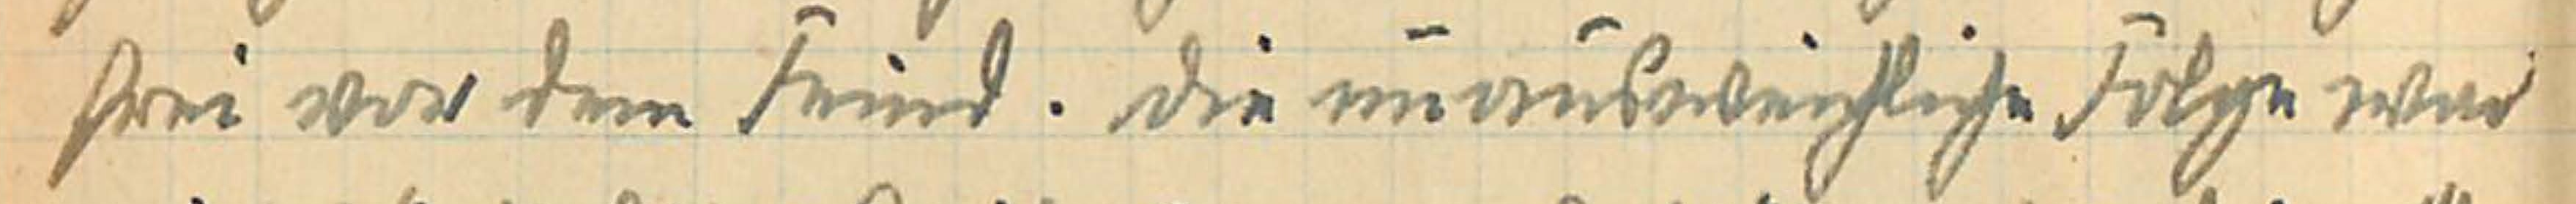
frei vor dem Feind. Die unausweichliche Folge war
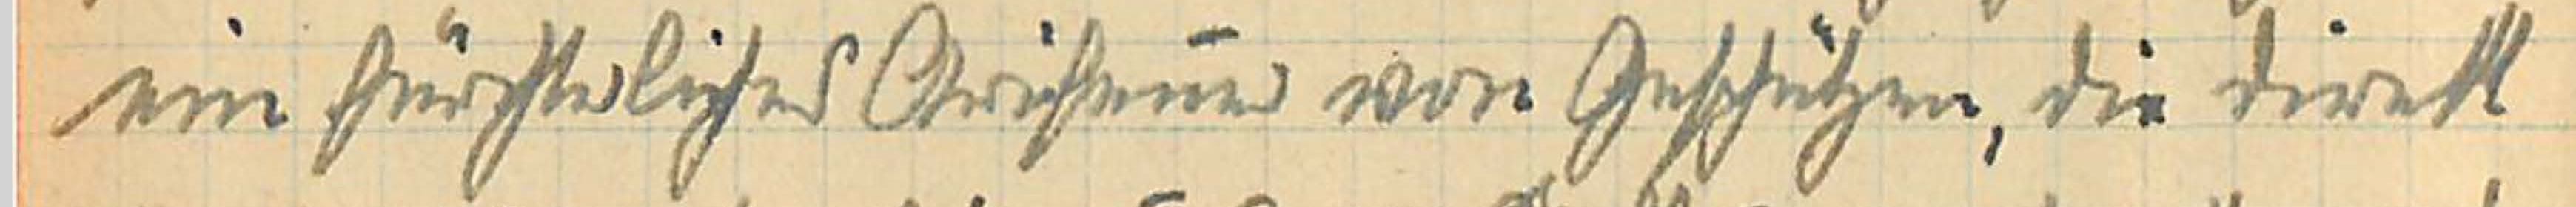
ein fürchterliches Arifeuer von Geschützen, die direkt
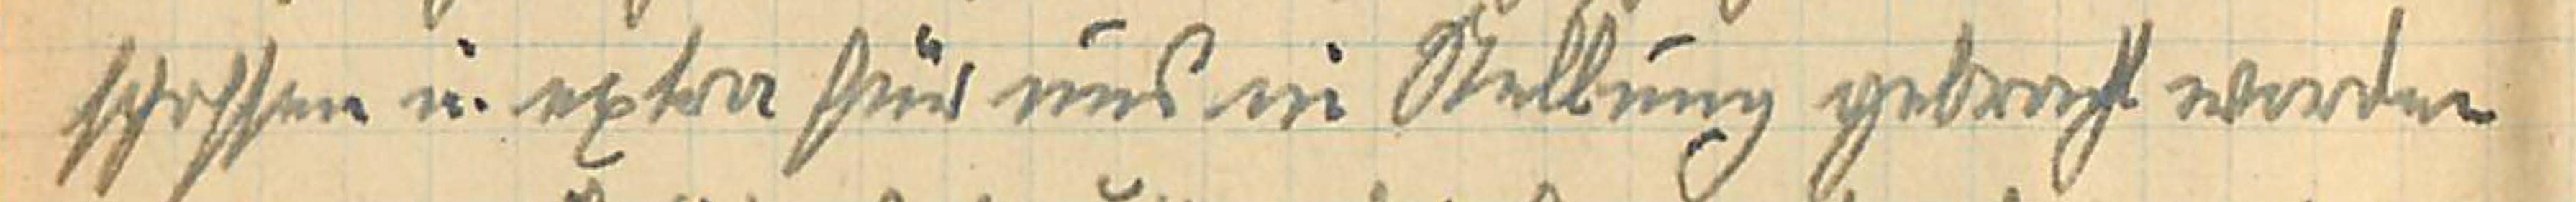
schossen u. extra für uns in Stellung gebracht worden
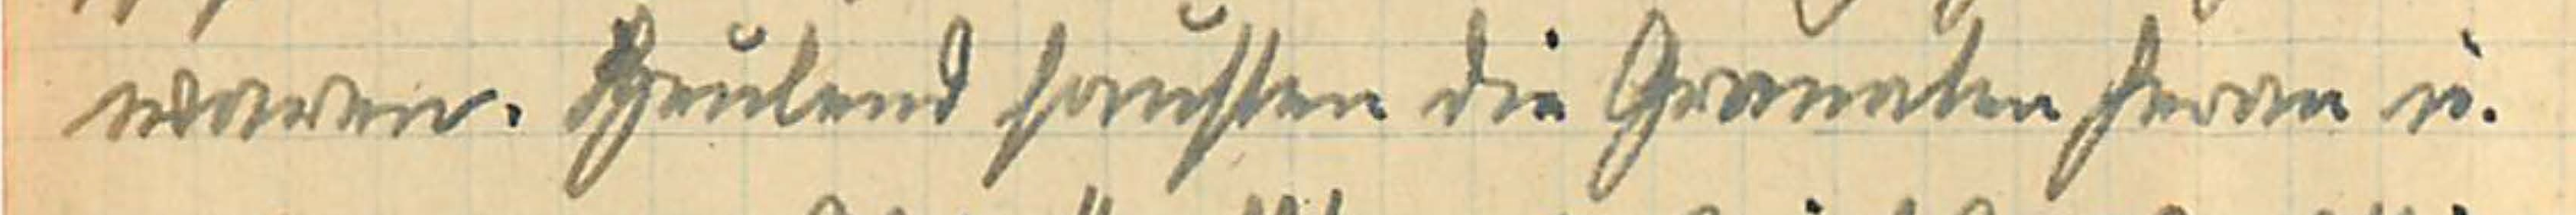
waren. Heulend sausten die Granaten heran u.
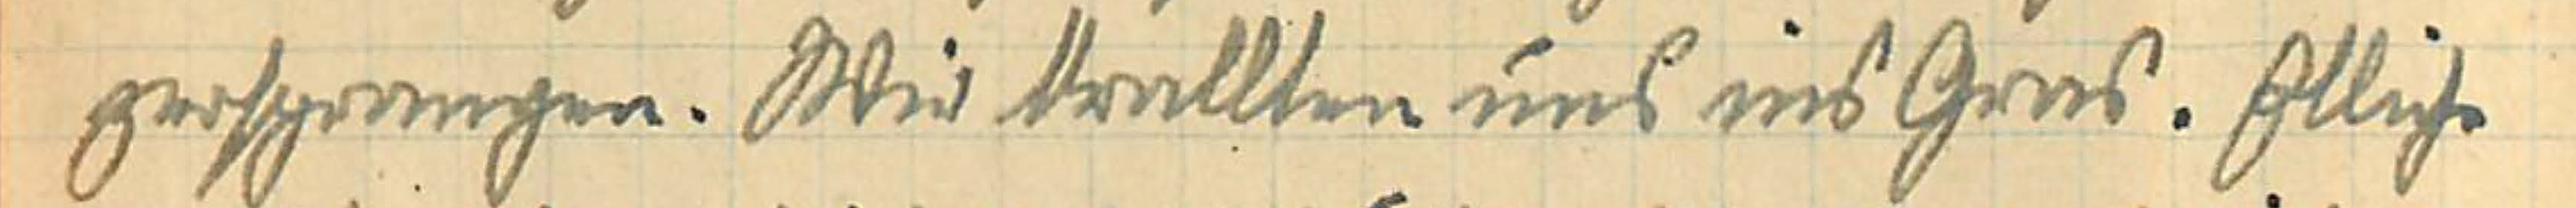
zersprangen. Wir krallten uns ins Gras. Etliche
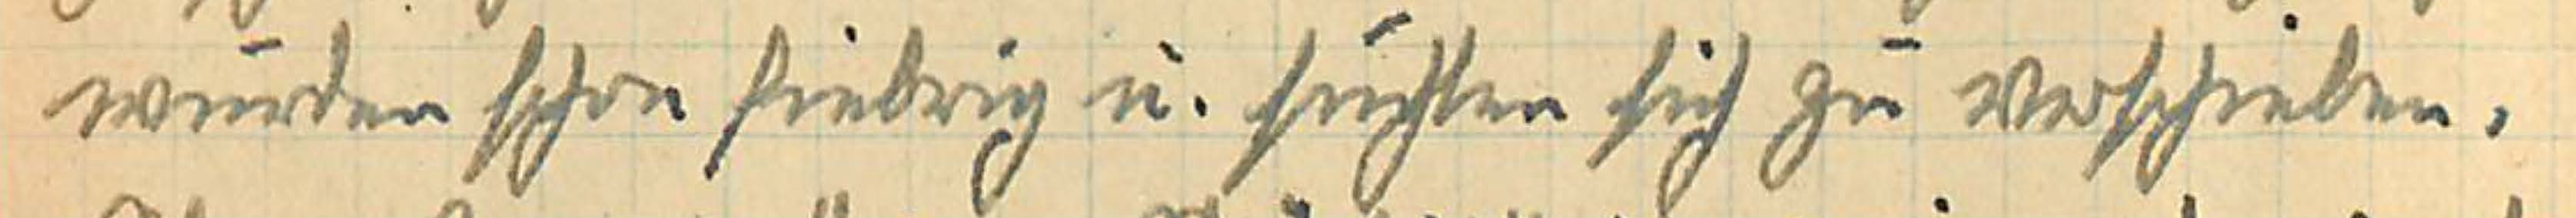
wurden schon fiebrig u. suchten sich zu verschieben.
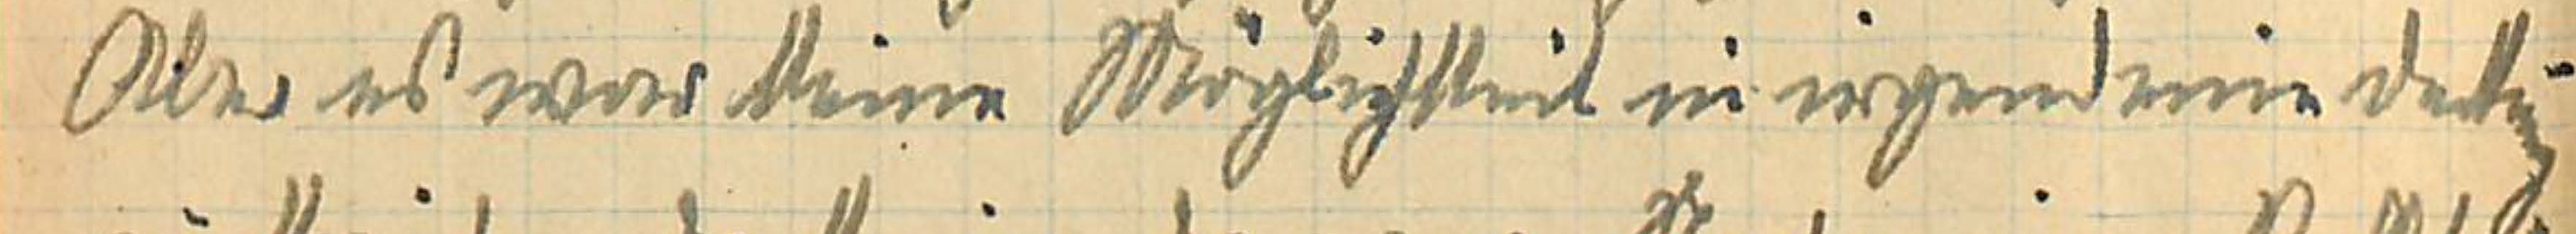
Aber es war keine Möglichkeit in irgendeine Deckung
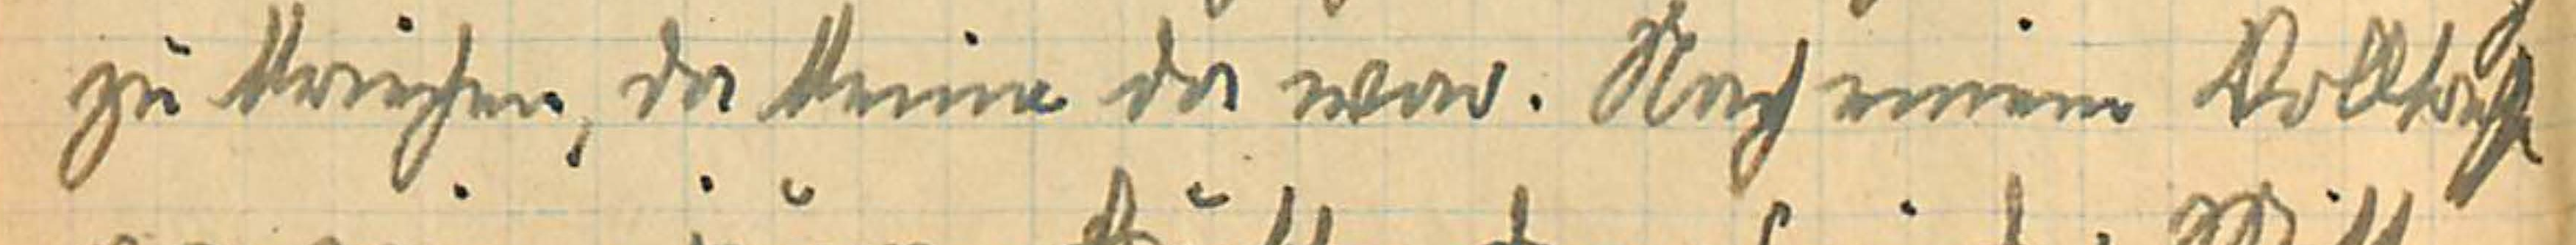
zu kriechen, da keine da war. Nach einem Volltreffer
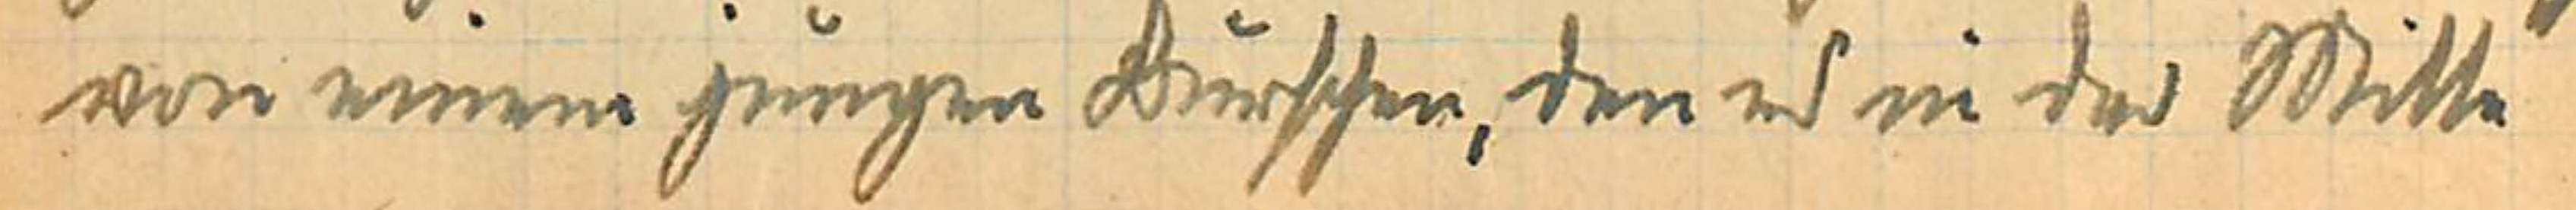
von einem jungen Burschen, den es in der Mitte
